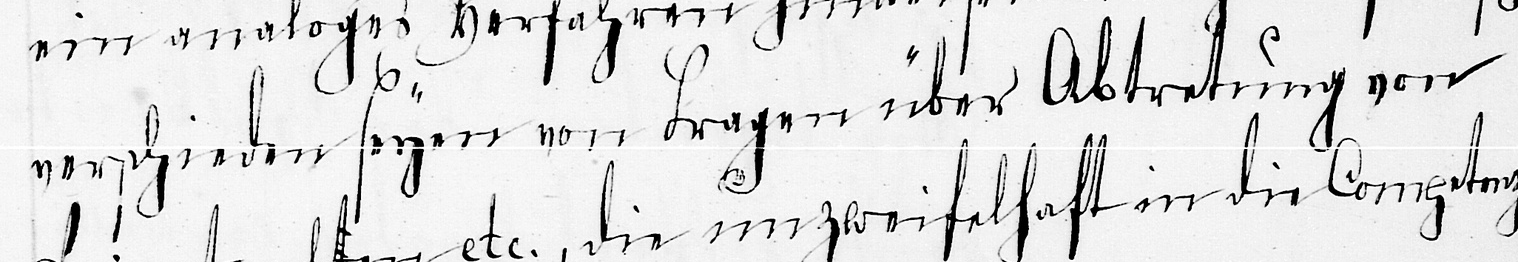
verschieden seyen von Fragen über Abtretung von
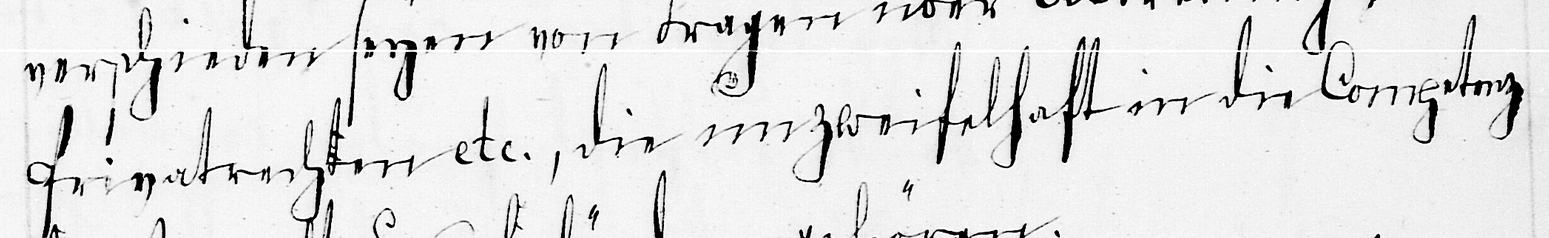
Privatrechten etc., die unzweifelhaft in die Competenz
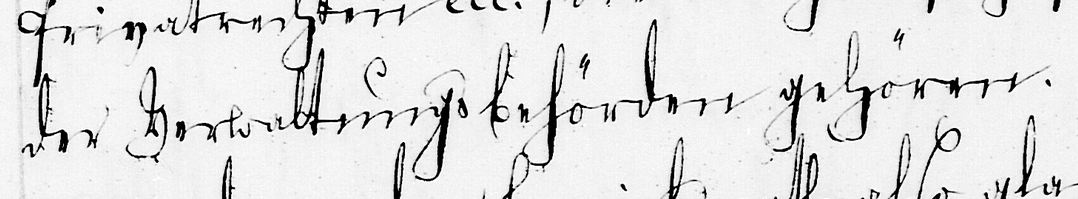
der Verwaltungsbehörden gehören.
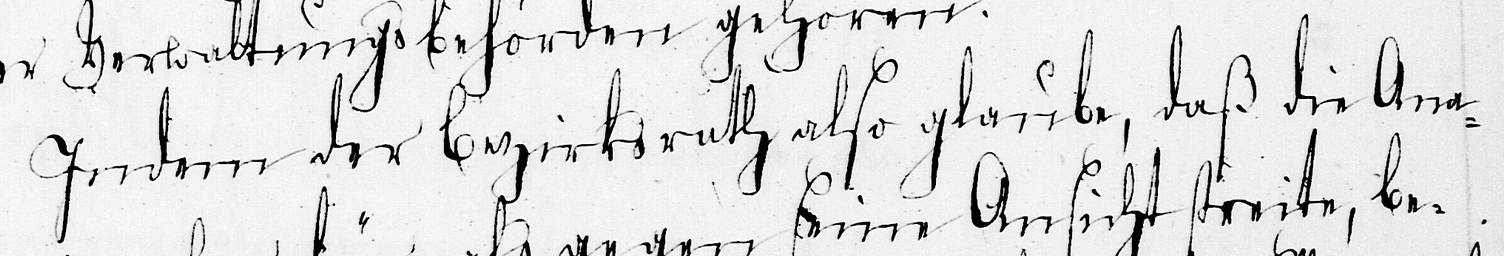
Indem der Bezirksrath also glaube, daß die Ana¬
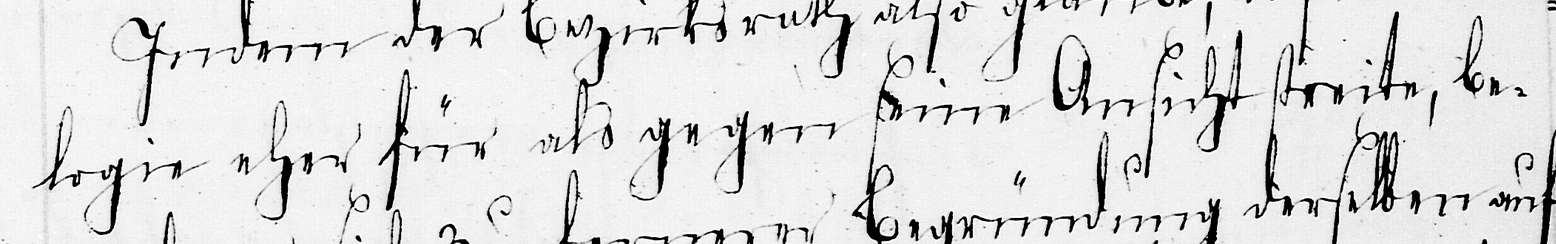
logie eher für als gegen seine Ansicht streite, be¬
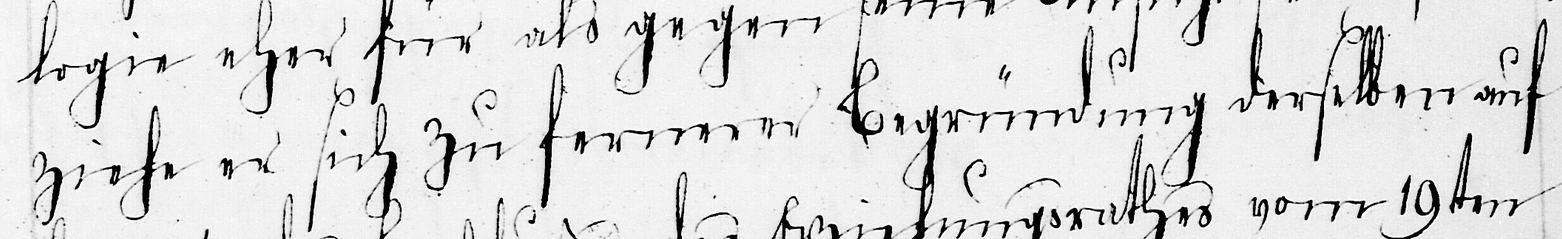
ziehe er sich zu fernerer Begründung derselben auf
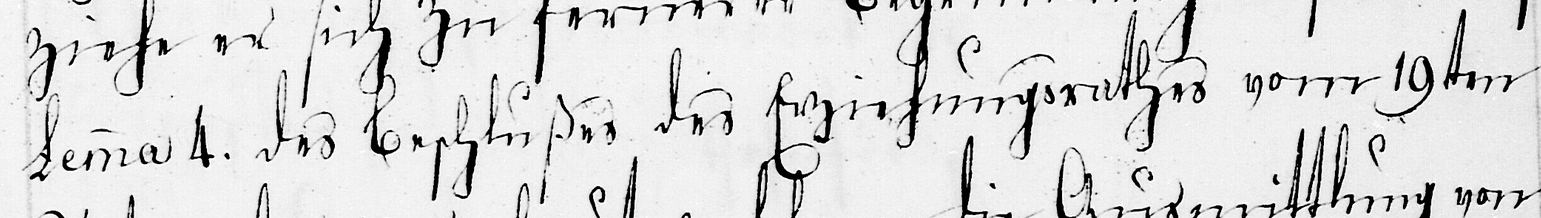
Lemma 4. des Beschlußes des Erziehungsrathes vom 19ten
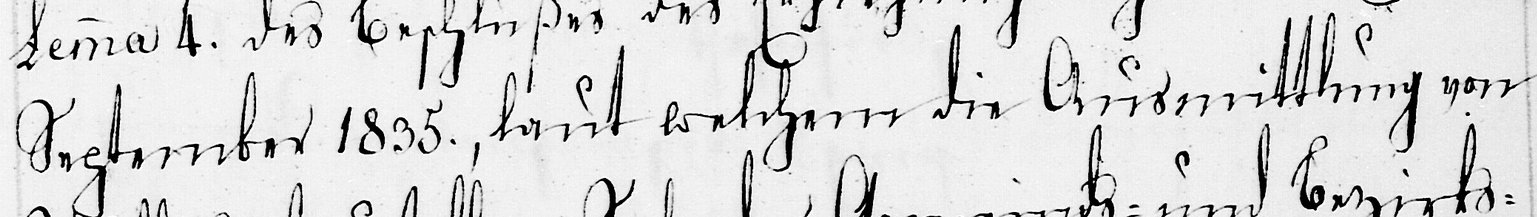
September 1835., laut welchem die Ausmittlung von
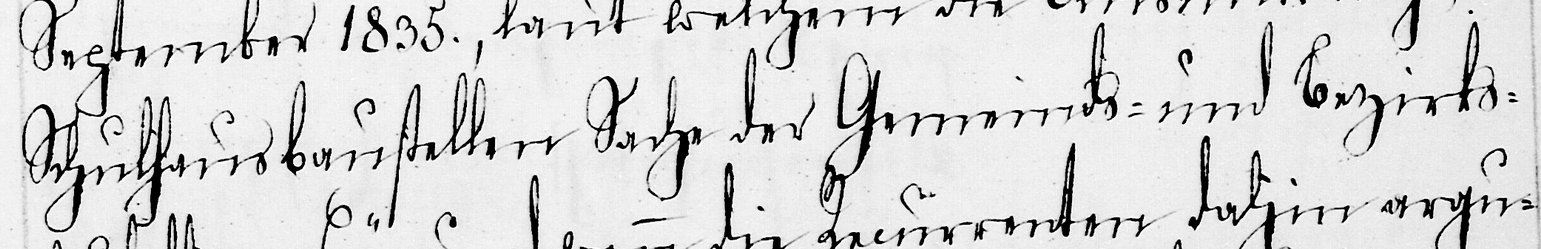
Schulhausbaustellen Sache der Gemeinds- und Bezirks¬
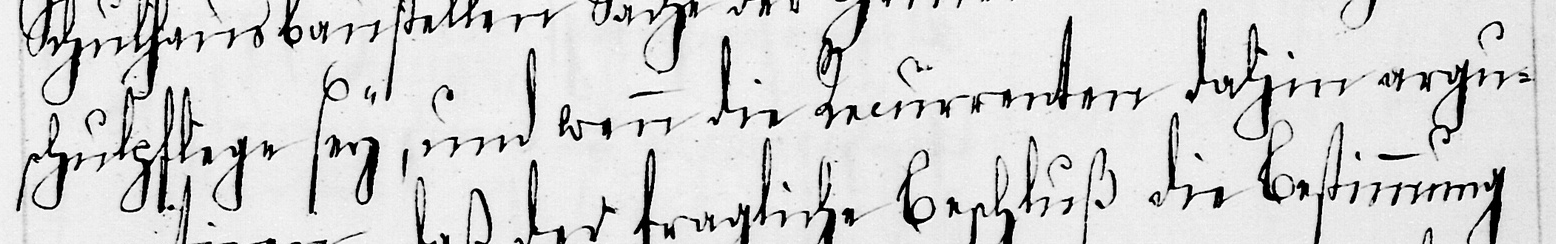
schulpflege sey, und wenn die Recurrenten dahin argu¬
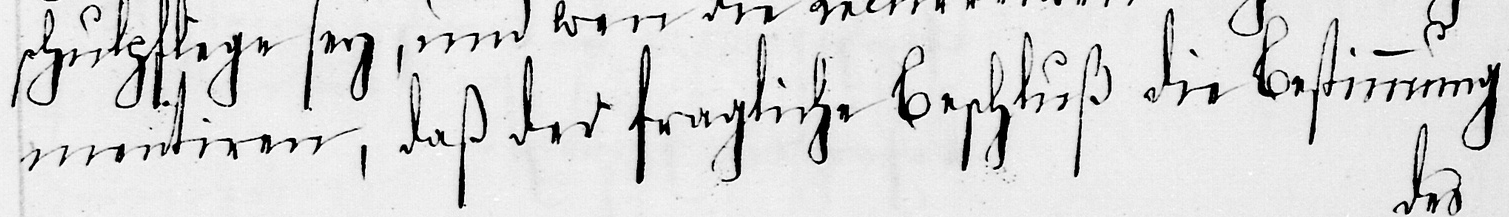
mentiren, daß der fragliche Beschluß die Bestimmung
